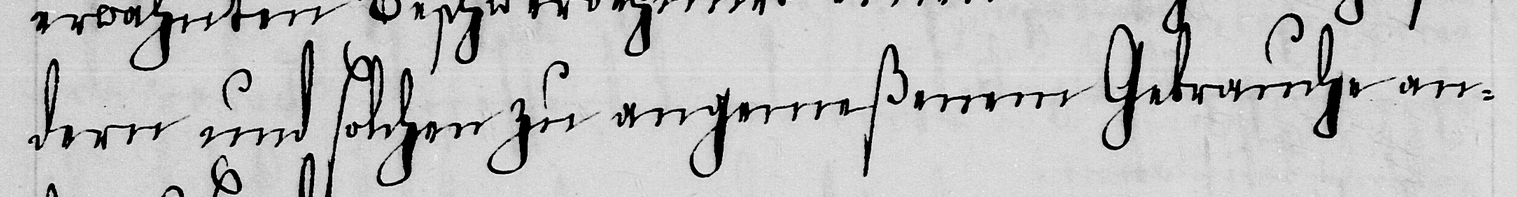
dern und solchen zu angemeßenem Gebrauche an¬
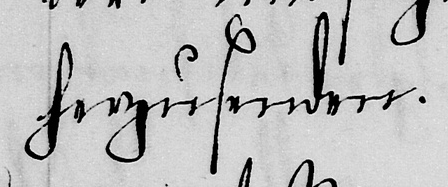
herzusenden.
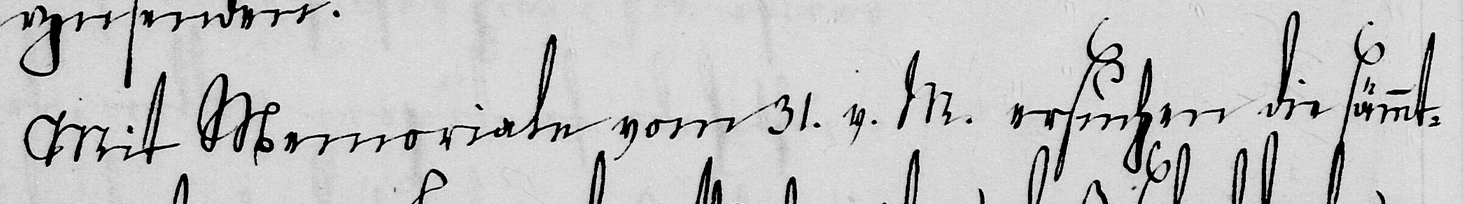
Mit Memoriale vom 31. v. M. ersuchen die sämmt¬
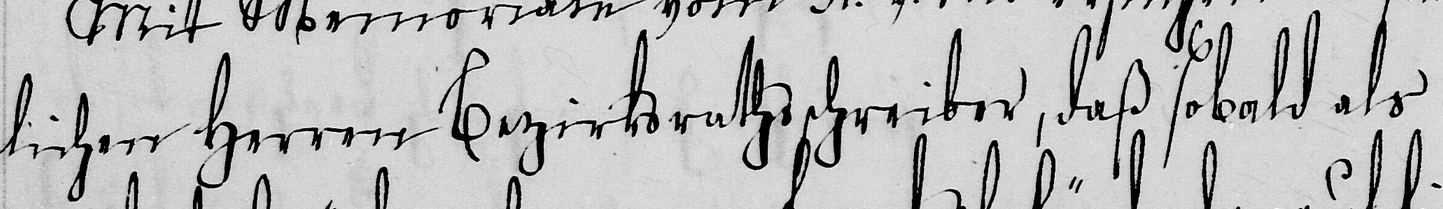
lichen Herren Bezirksrathsschreiber, daß sobald als
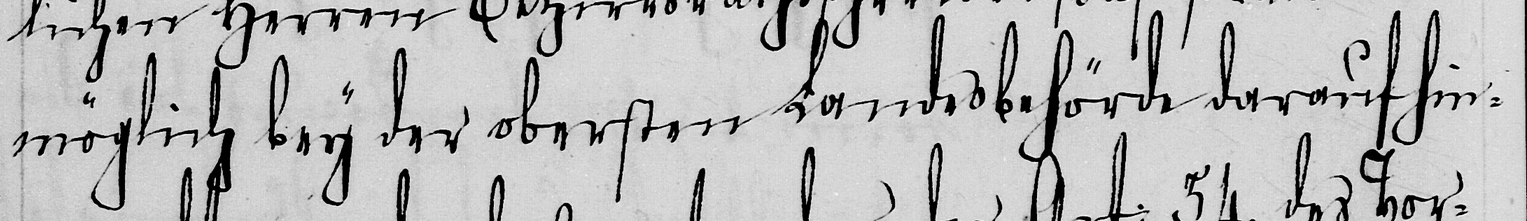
möglich bey der obersten Landesbehörde darauf hin¬
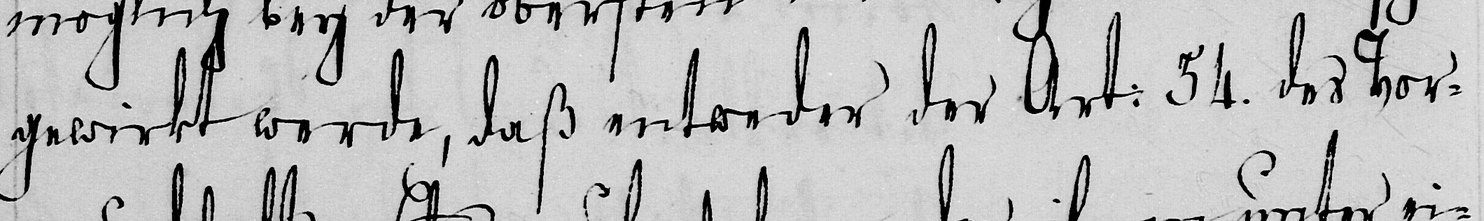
gewirkt werde, daß entweder der Art: 54. des Vor¬
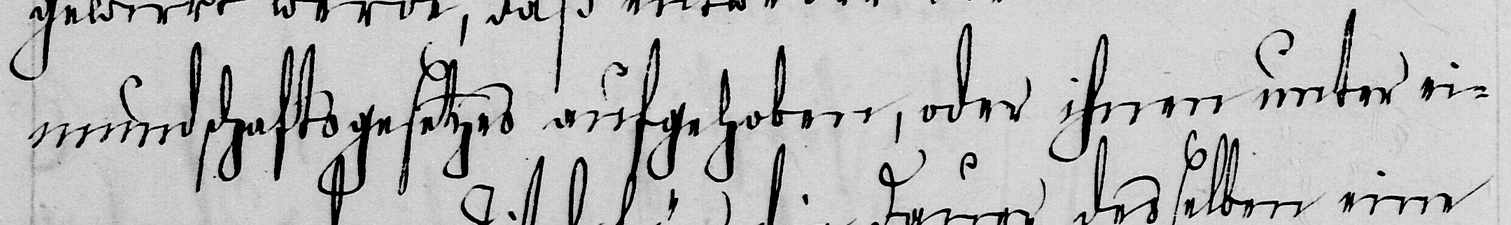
mundschaftsgesetzes aufgehoben, oder ihnen unter ei¬
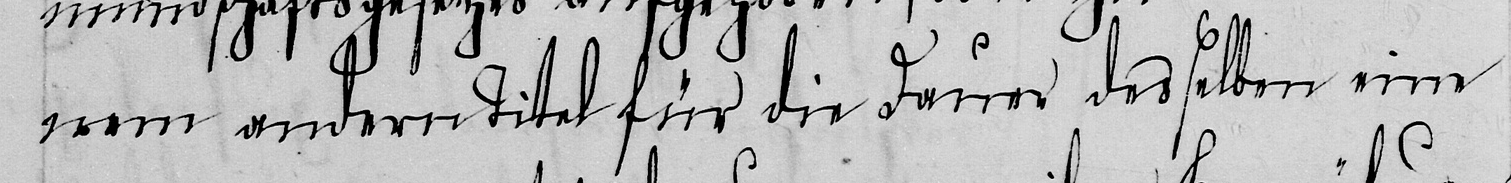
nem andern Titel für die Dauer desselben eine
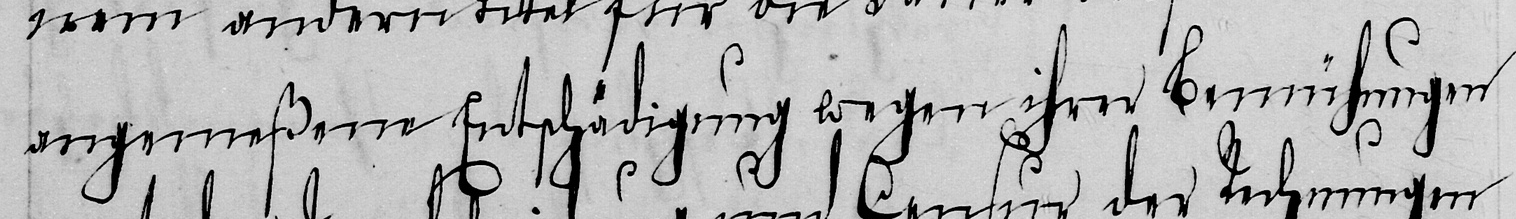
angemeßene Entschädigung wegen ihrer Bemühungen
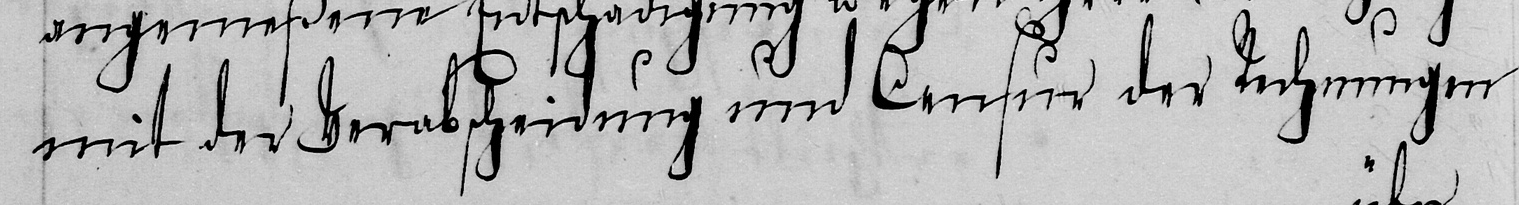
mit der Verabscheidung und Censur der Rechnungen
